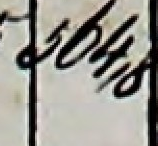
564,8
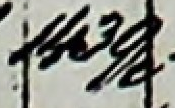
1439/c
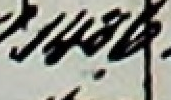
1486
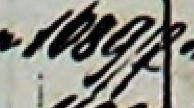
1689/f
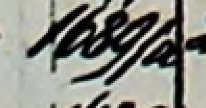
1689/a
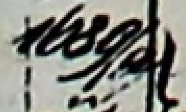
1689/a
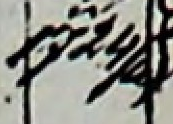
1724/a
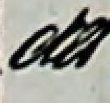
Alt
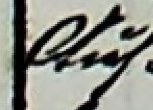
Aus
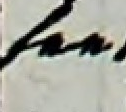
see
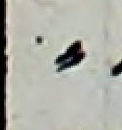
„
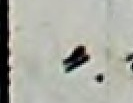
„
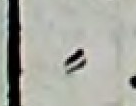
„
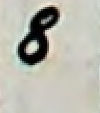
8
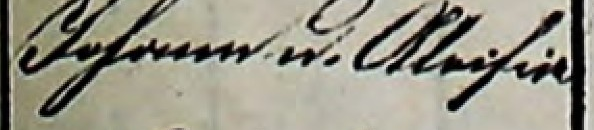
Johann u. Ateisia
